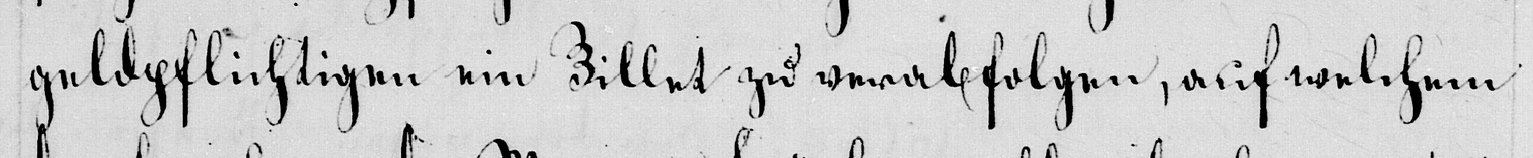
geldpflichtigen ein Billet zu verabfolgen, auf welchem
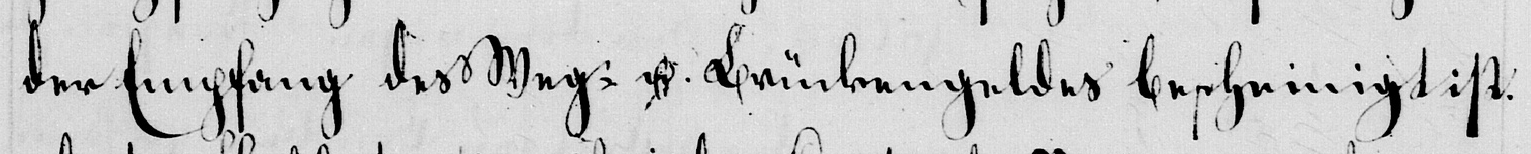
der Empfang des Weg- u. Brückengeldes bescheinigt ist.
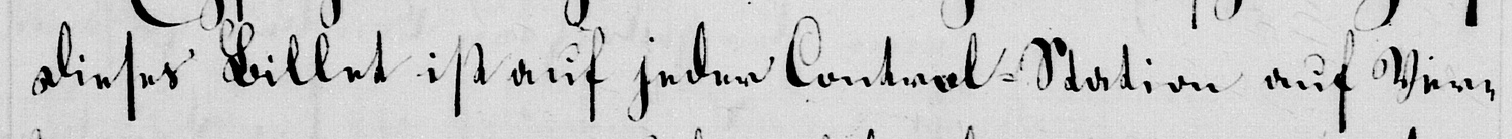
Dieses Billet ist auf jeder Control-Station auf Ver¬
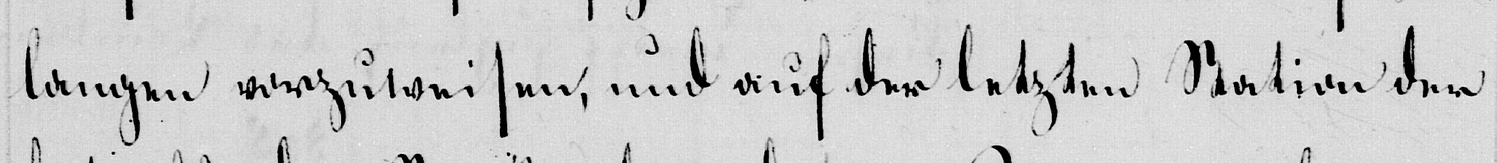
langen vorzuweisen, und auf der letzten Station der
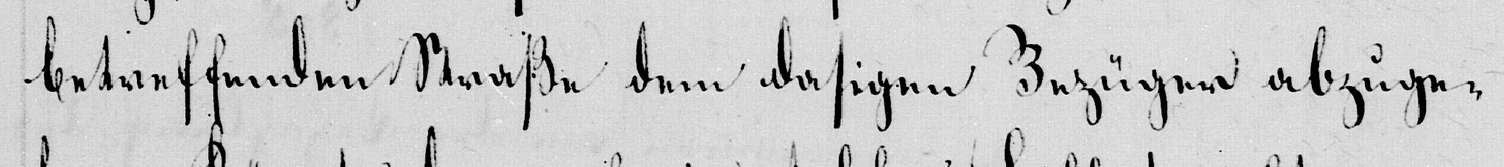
betreffenden Straße dem dasigen Bezüger abzuge¬
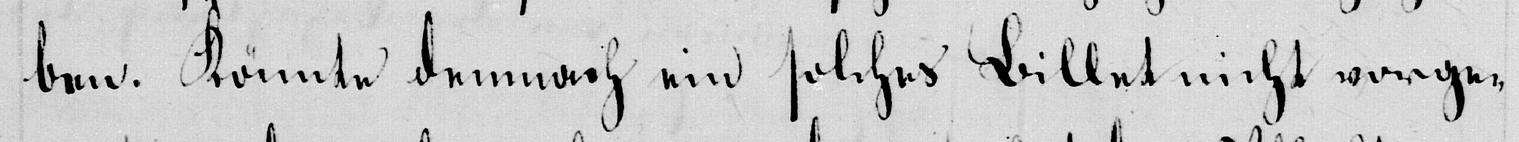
ben. Könnte demnach ein solches Billet nicht vorge¬
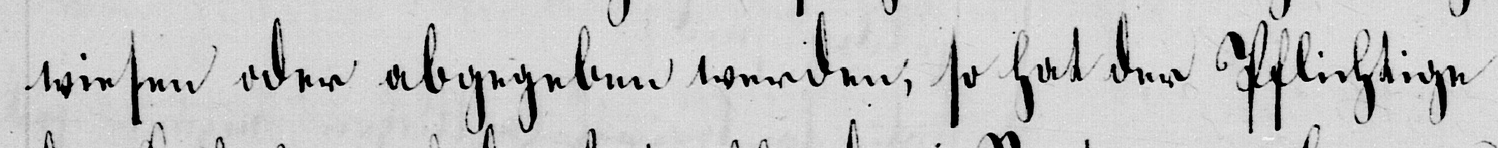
wiesen oder abgegeben werden, so hat der Pflichtige
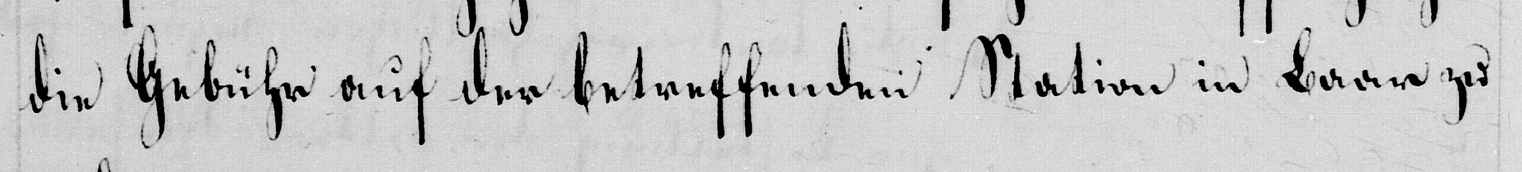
die Gebühr auf der betreffenden Station in Baar zu
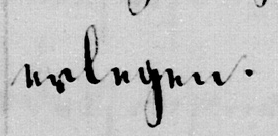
erlegen.
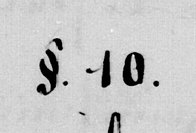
§. 10.
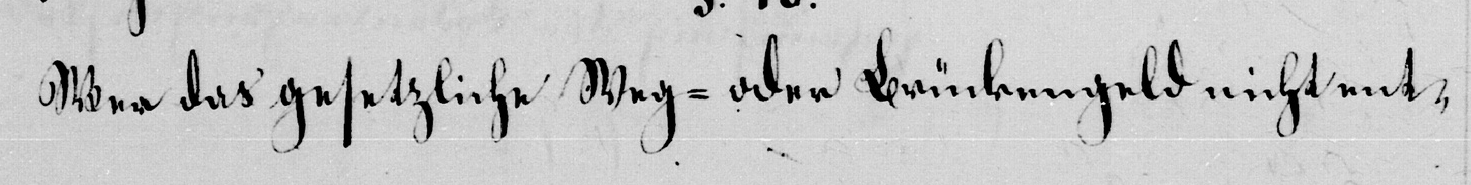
Wer das gesetzliche Weg- oder Brückengeld nicht ent-
